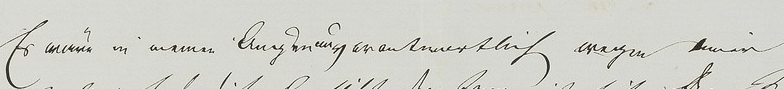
Es wäre in meinen Augen unverantwortlich wegen einer
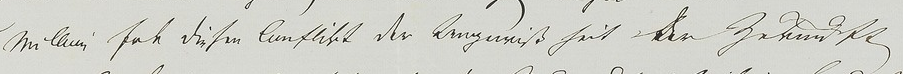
Million Frk diesen Conflikt der Ungewißheit der Zukunft
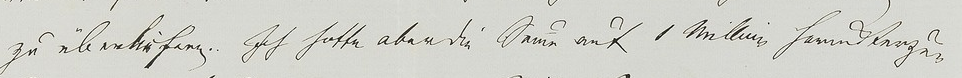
zu überliefern. Ich hoffe aber die Summe auf 1 Million herunterzu-
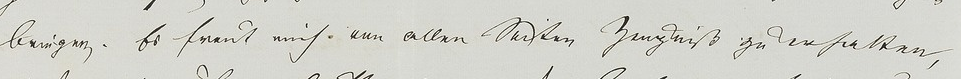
bringen. Es freut mich von allen Seiten Zeugniß zu erhalten,
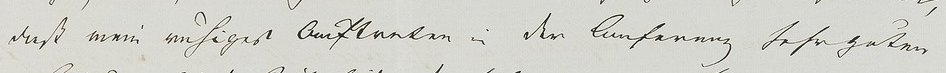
daß mein ruhiges Auftreten in der Conferenz sehr guten
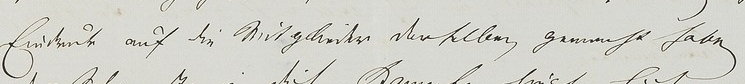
Eindruk auf die Mitglieder derselben gemacht habe. –
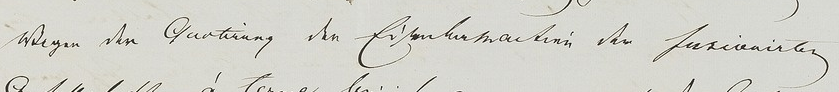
Wegen der Quotirung der Eisenbahnactien der fusionirten
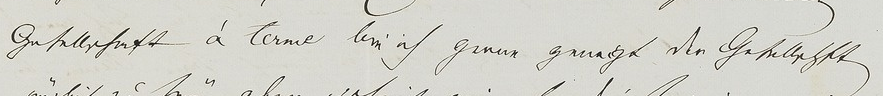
Gesellschaft à terme bin ich gerne geneigt der Gesellschft
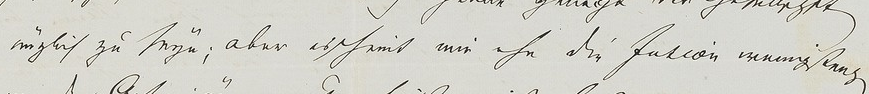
nüzlich zu seyn; aber es scheint mir ehe die Fusion wenigstens
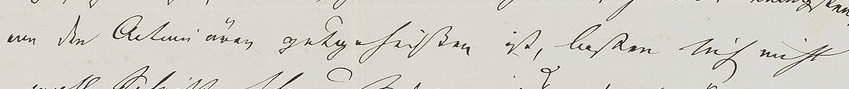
von den Actionären gutgeheißen ist, laßen sich nicht
